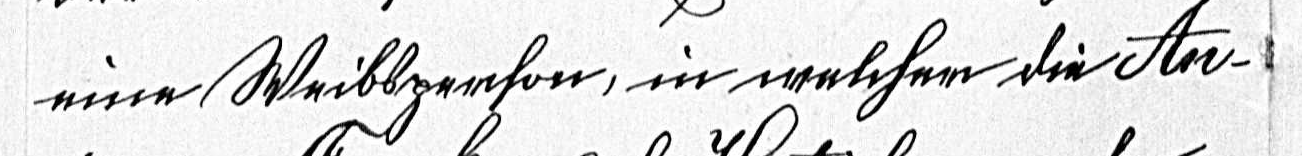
eine Weibsperson, in welcher die An¬
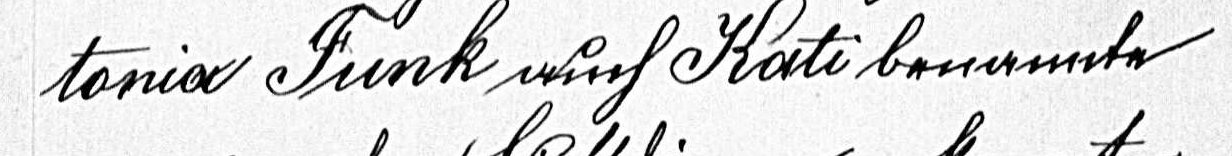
tonia Funk auch Kati benannte
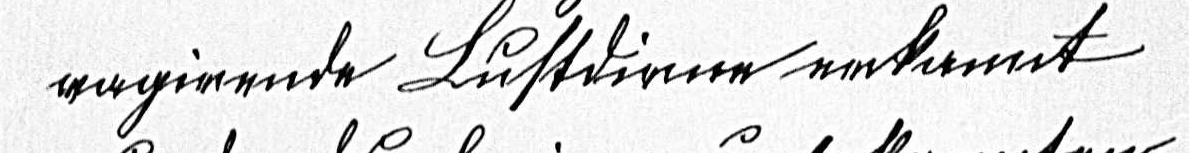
vagirende Lustdirne erkannt
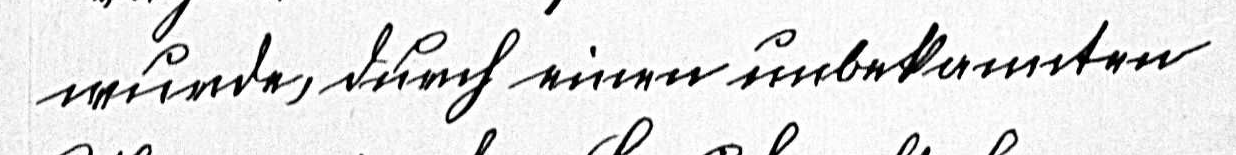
wurde, durch einen unbekannten
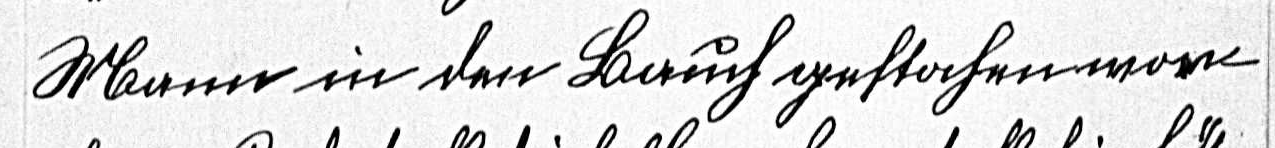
Mann in den Bauch gestochen wor¬
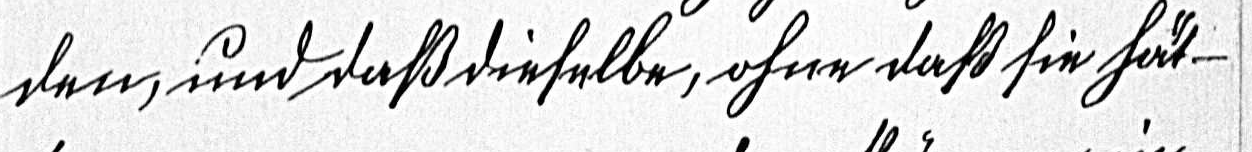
den, und daß dieselbe, ohne das sie hät¬
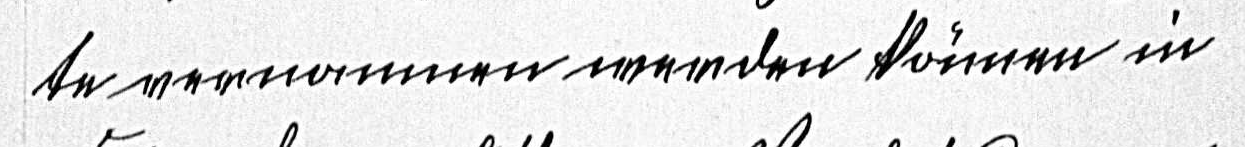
te vernommen werden können in
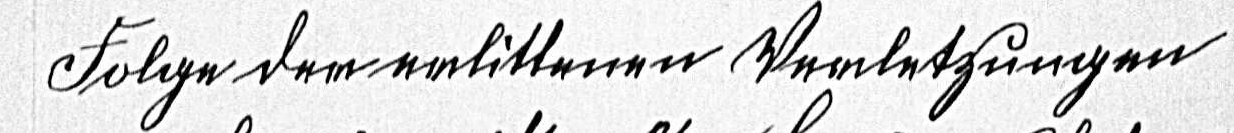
Folge der erlittenen Verletzungen
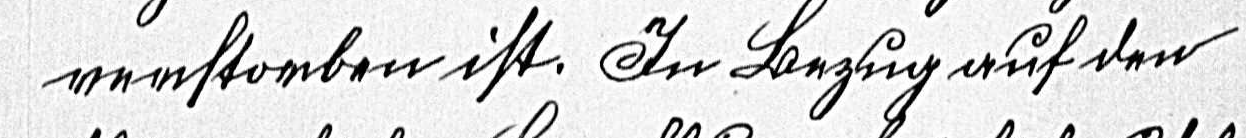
verstorben ist. In Bezug auf den
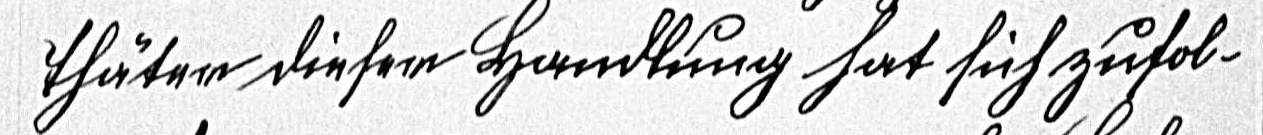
Thäter dieser Handlung hat sich zufol¬
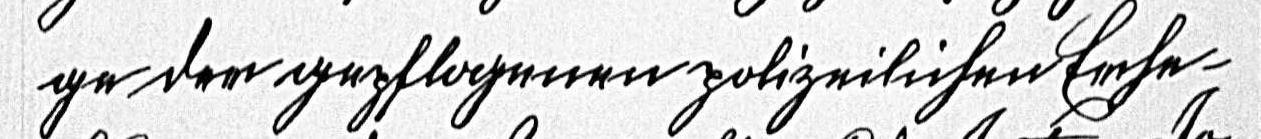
ge der gepflogenen polizeilichen Erhe¬
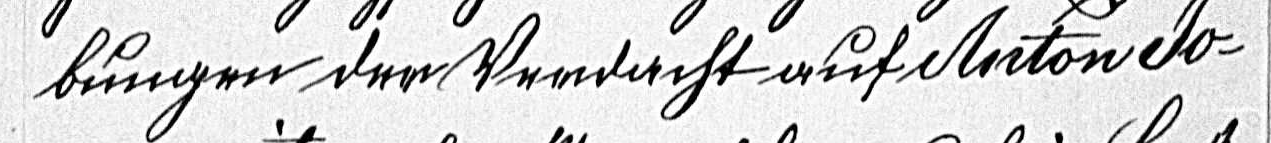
bungen der Verdacht auf Anton Jo¬
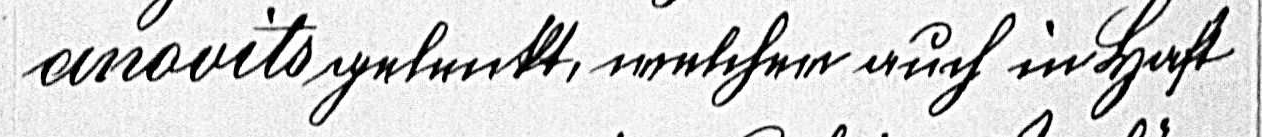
anovits gelenkt, welcher auch in Haft
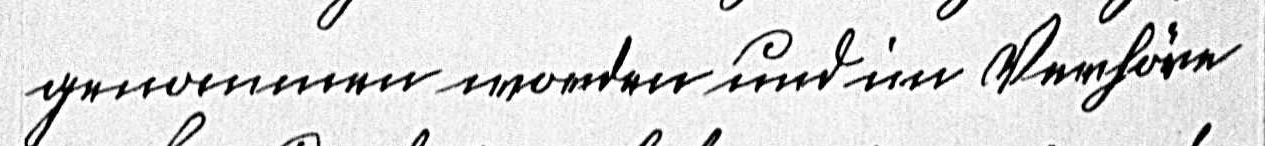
genommen worden und im Verhöre
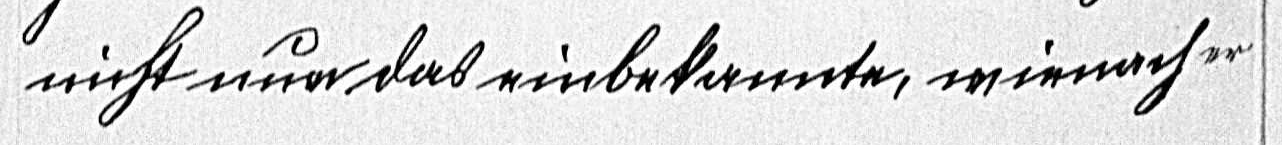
nicht nur das einbekannte, wienach er
